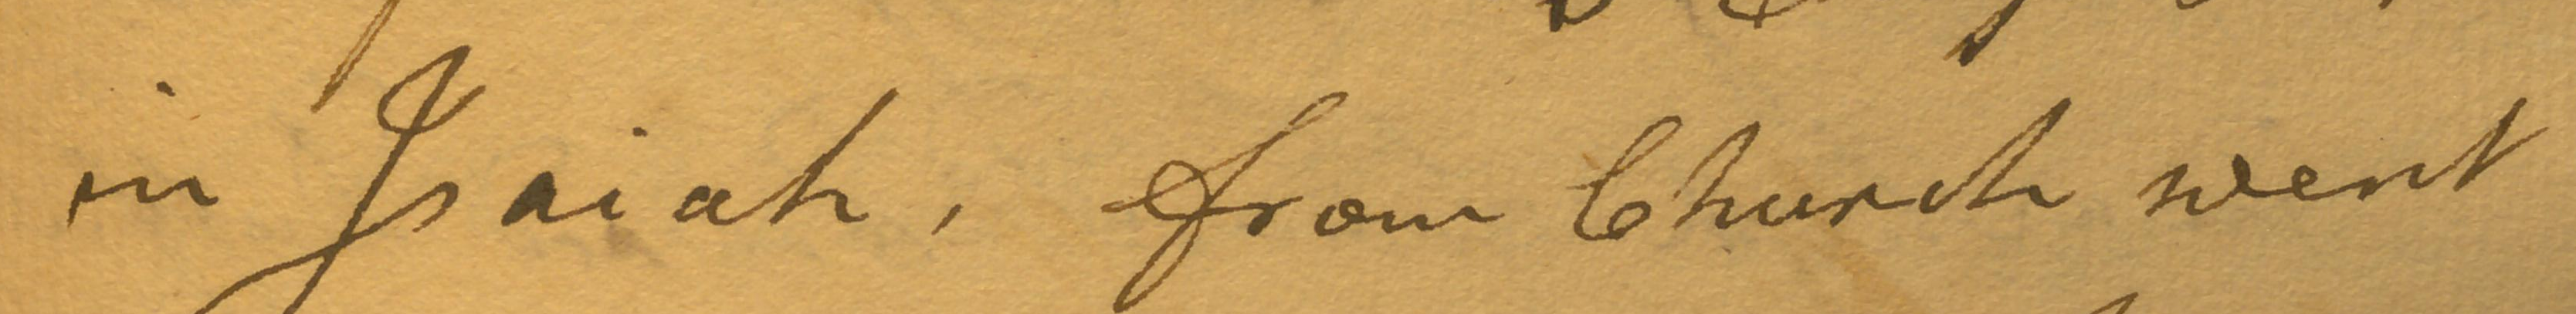in Isaiah, from Church went
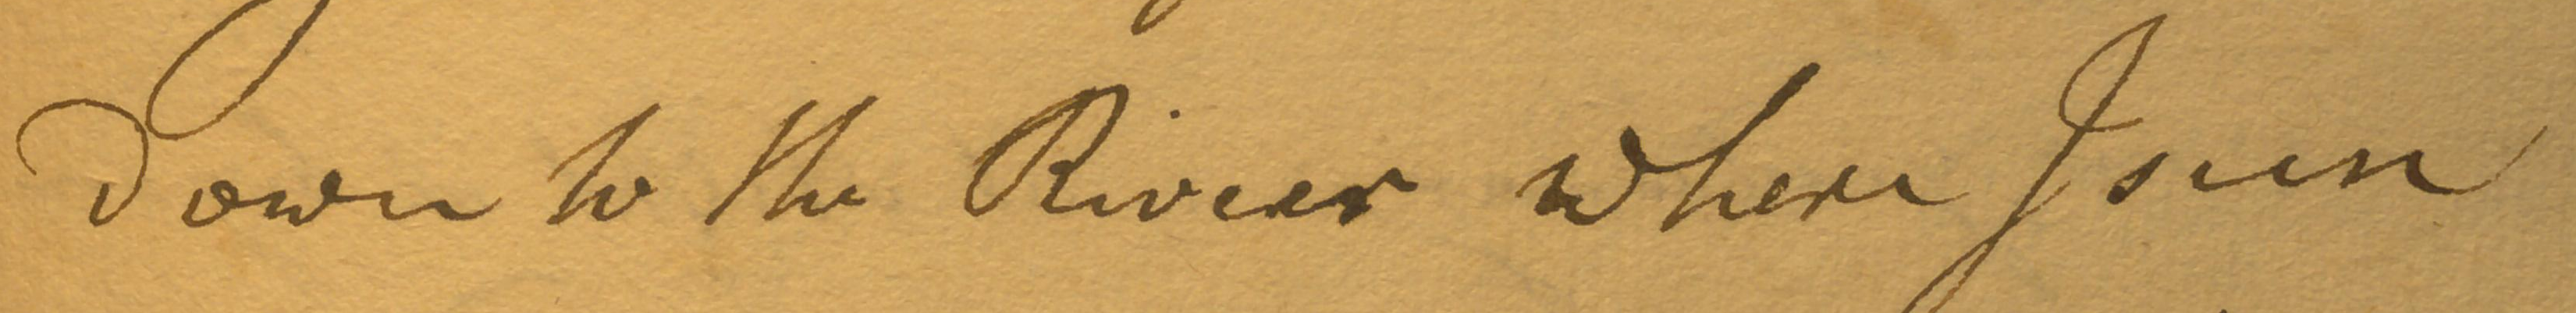down to the River where I seen
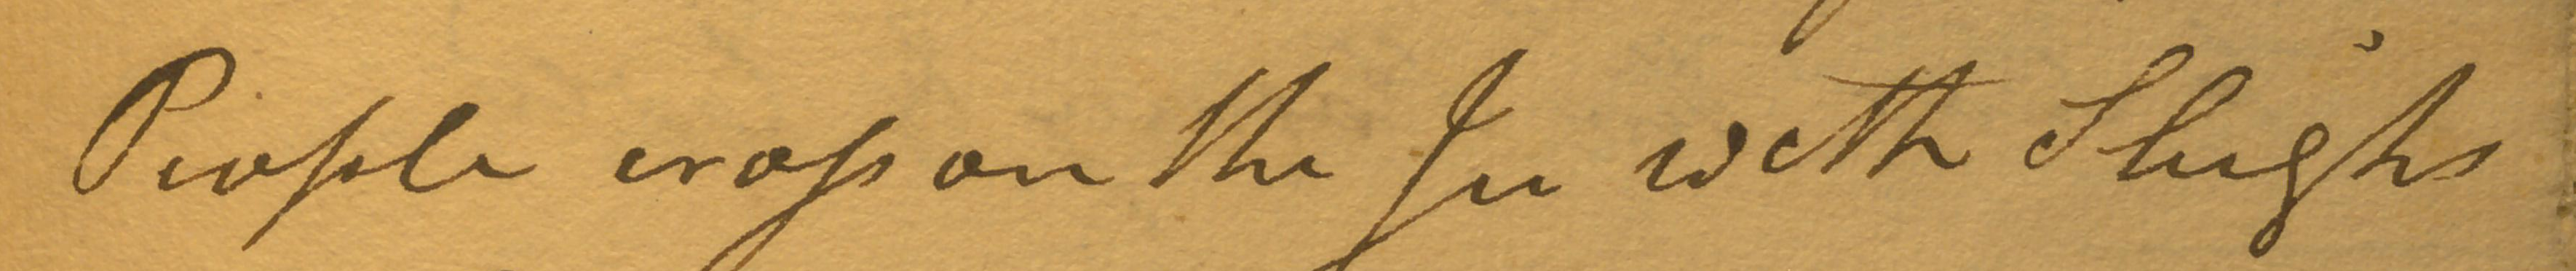People cross on the Ice with Sleighs
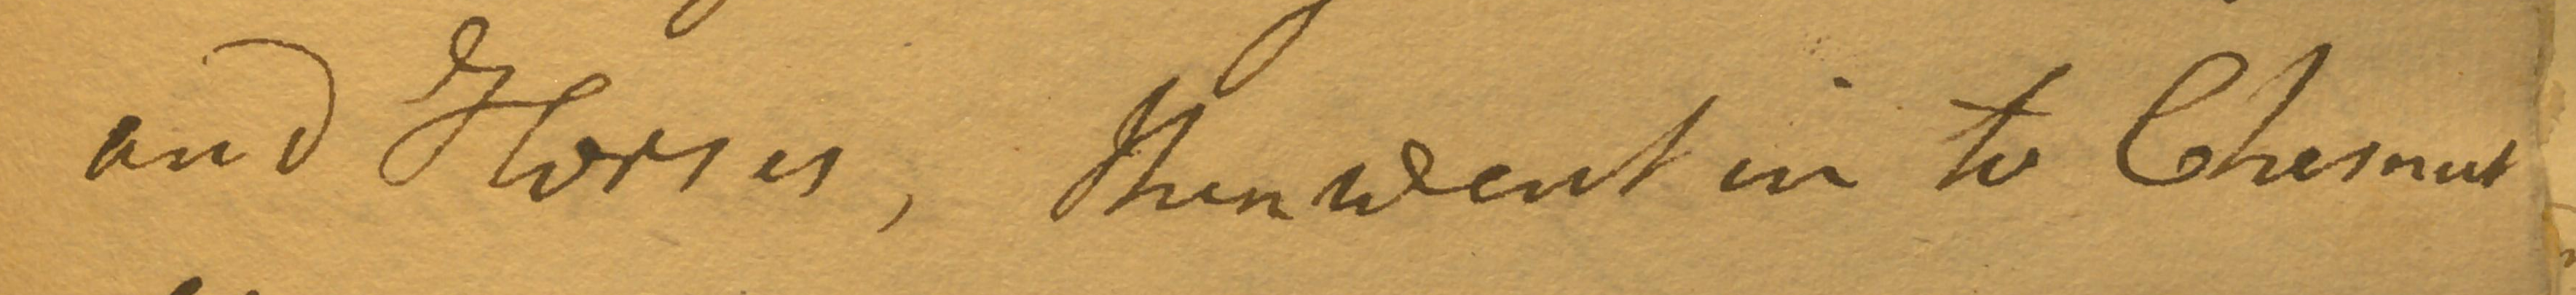and Horses, then went in to Chesnut
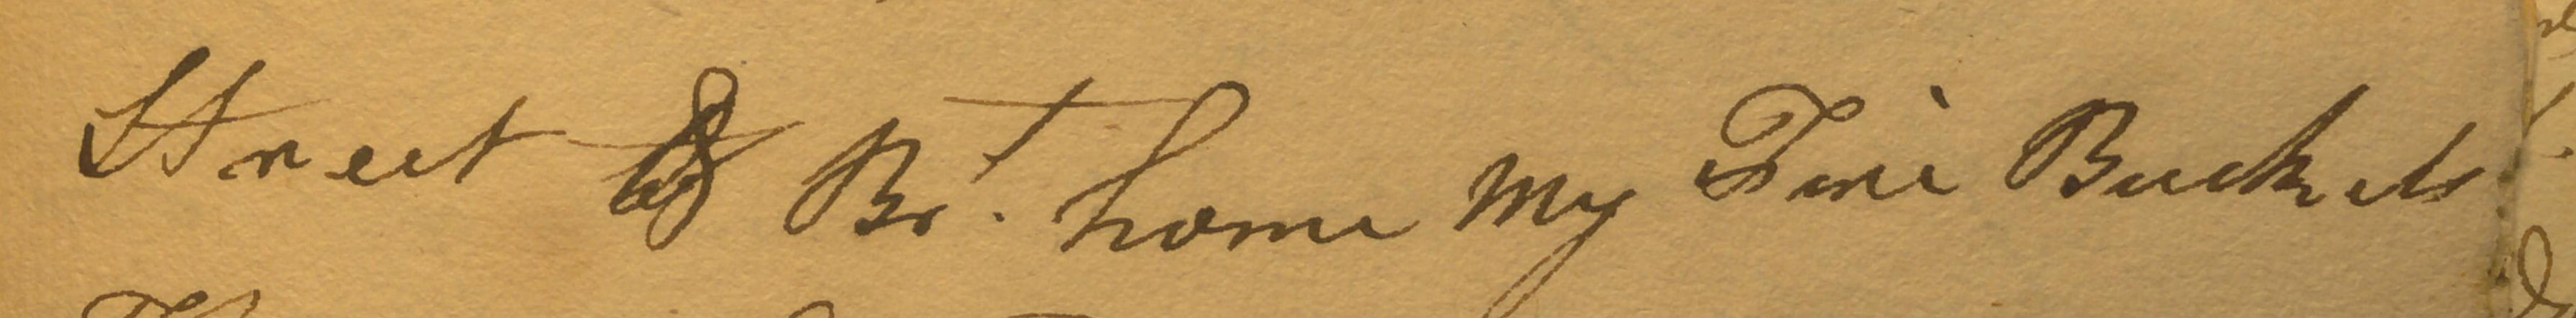Street & Br^t. home my Fine Buckets
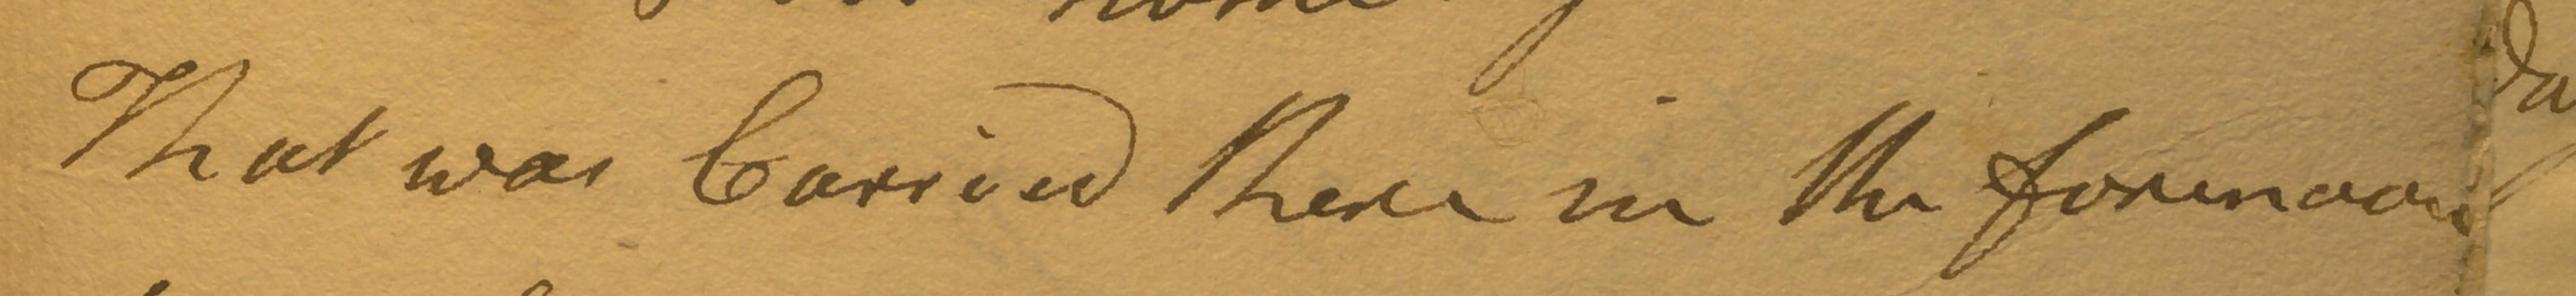That was Carried there in the forenoon
